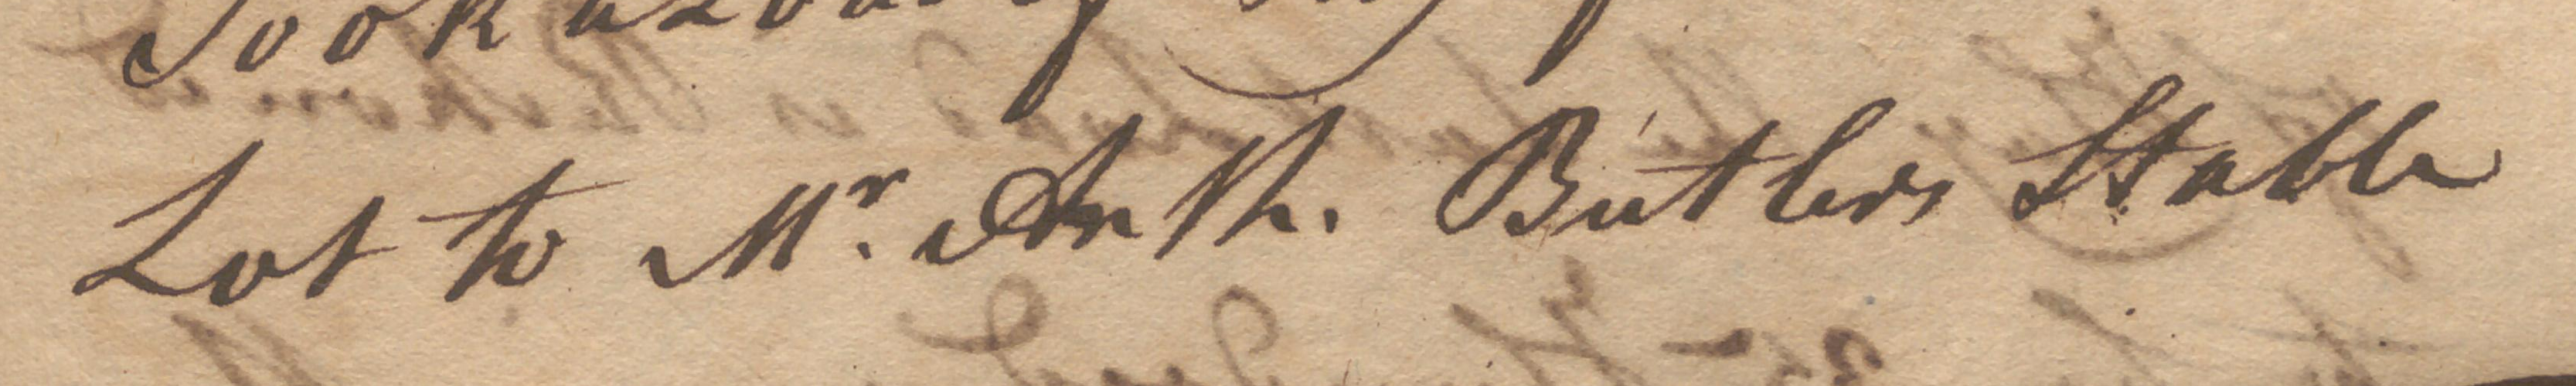Lot to M^r. Anth. Butlers Stable
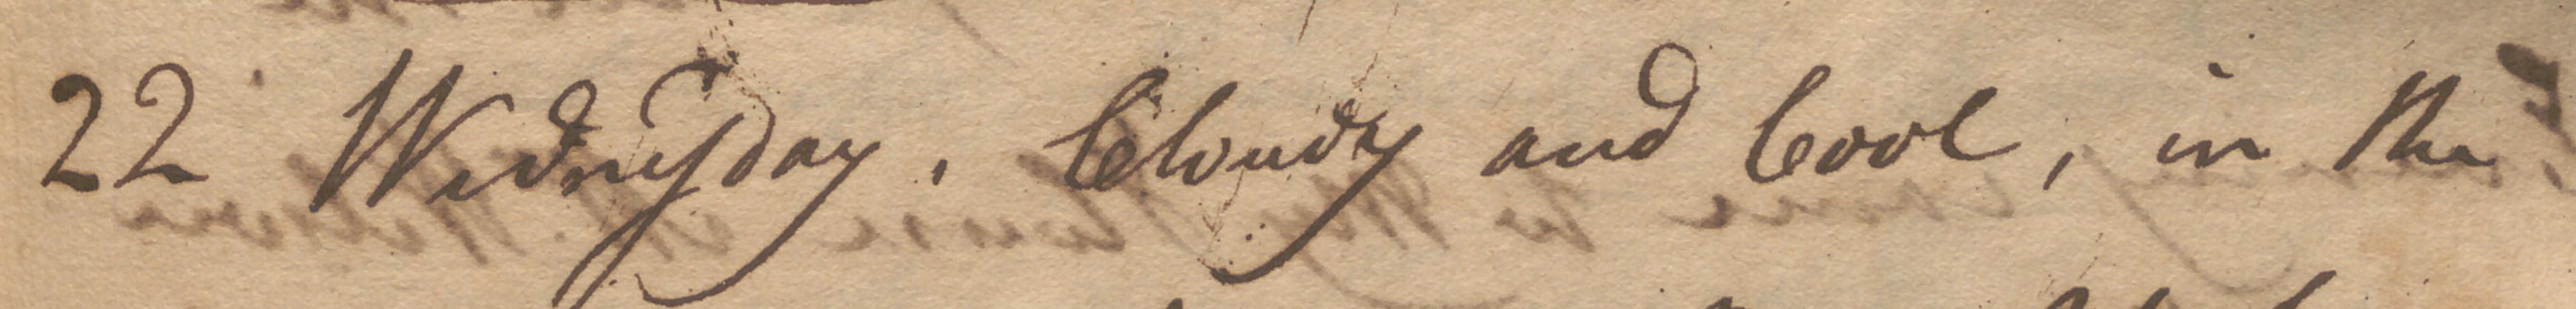22 Wednesday: Cloudy and Cool, in the
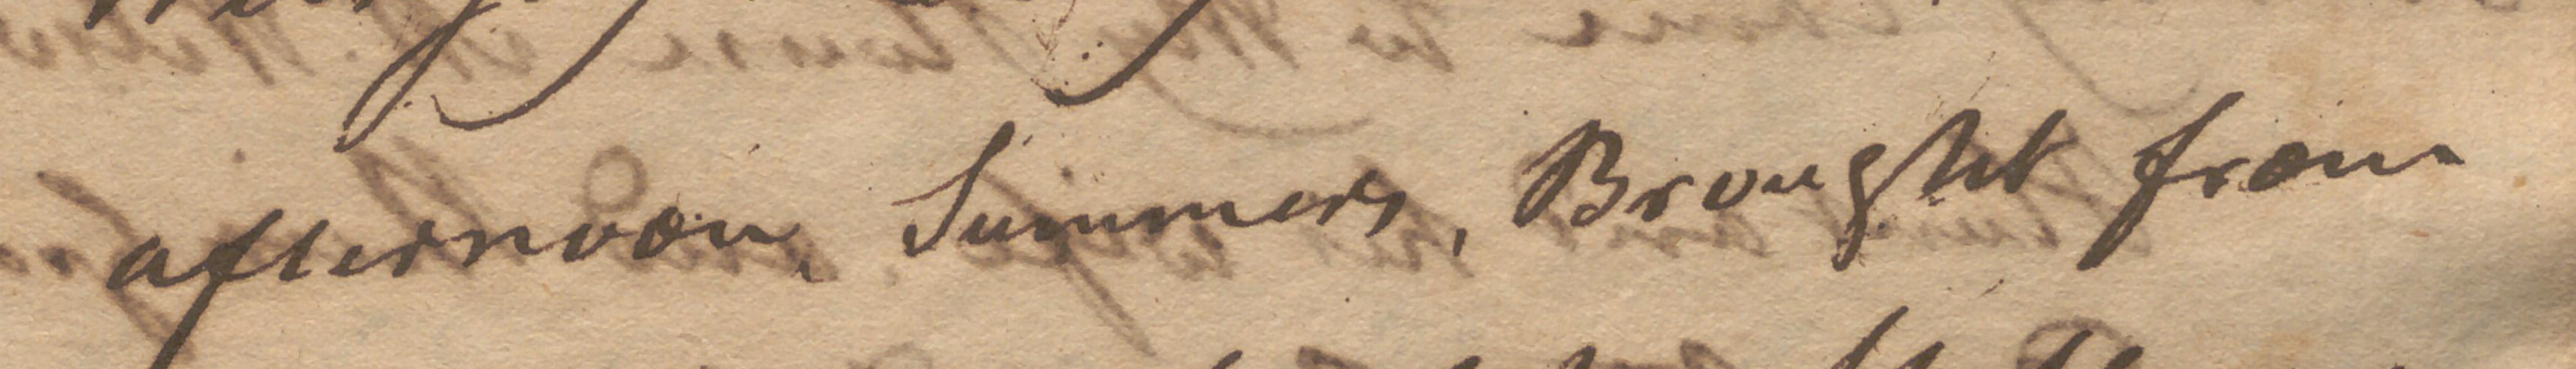afternoon Summers, Brought from
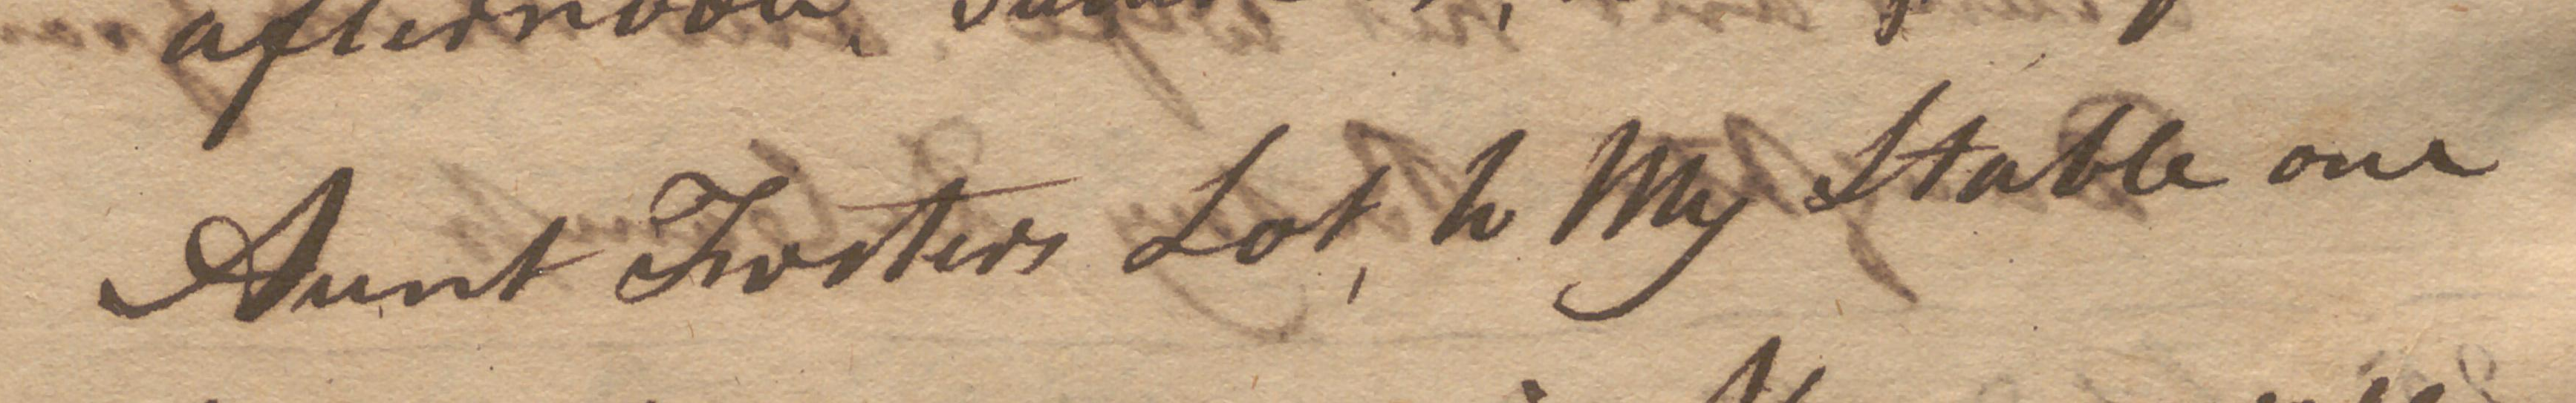Aunt Forters Lot to My Stable one
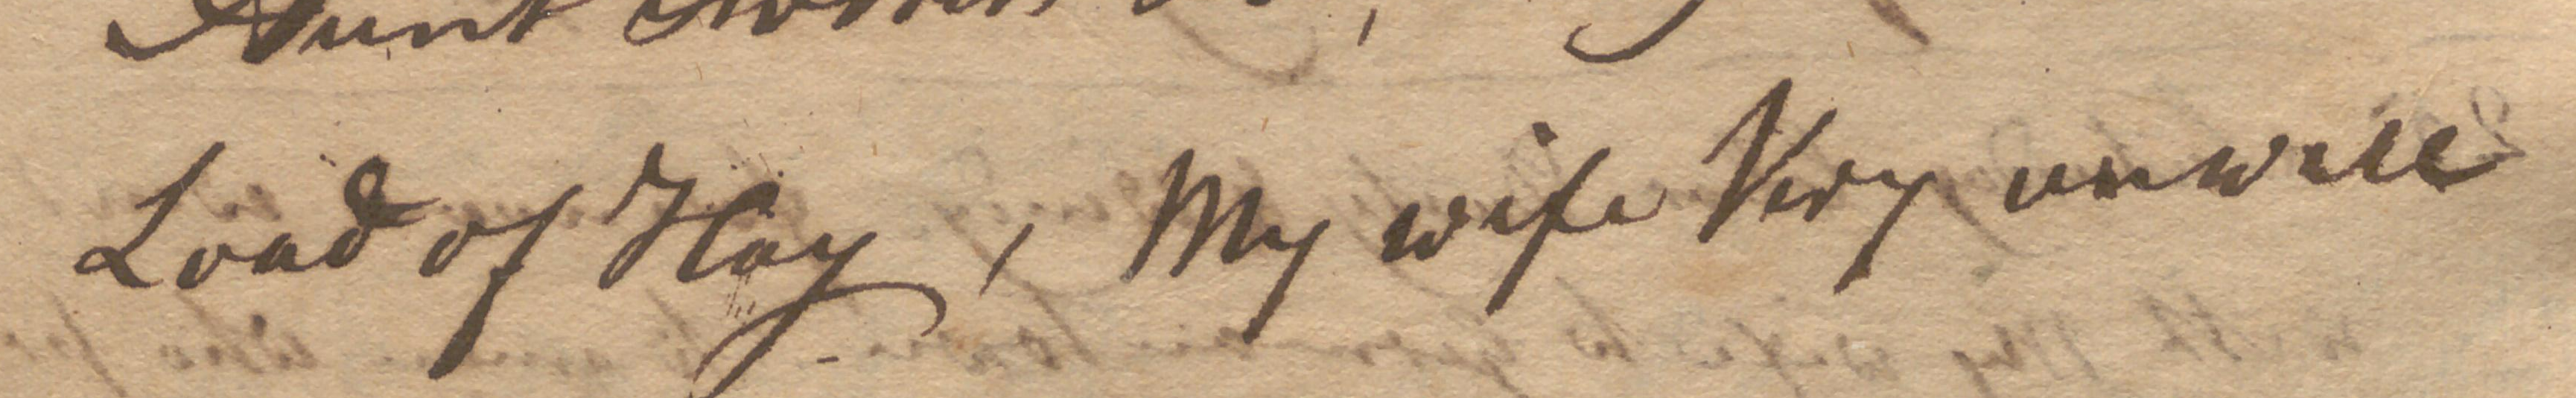Load of Hay, My wife Very unwell
